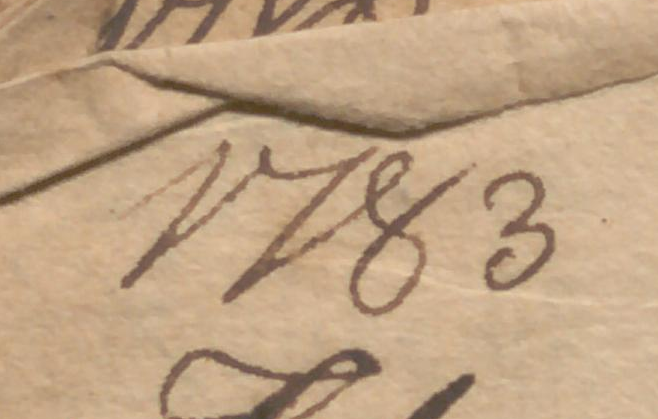1783
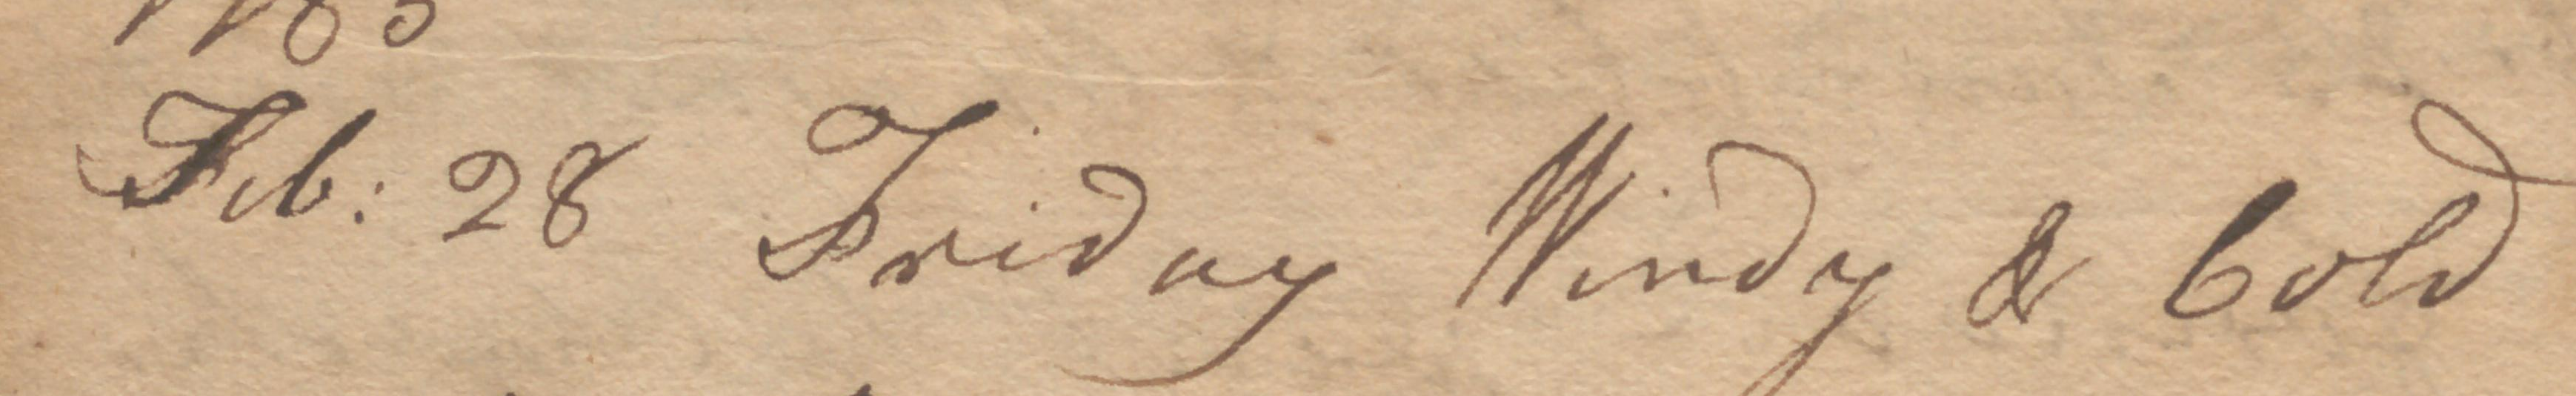Feb. 28 Friday Windy & Cold
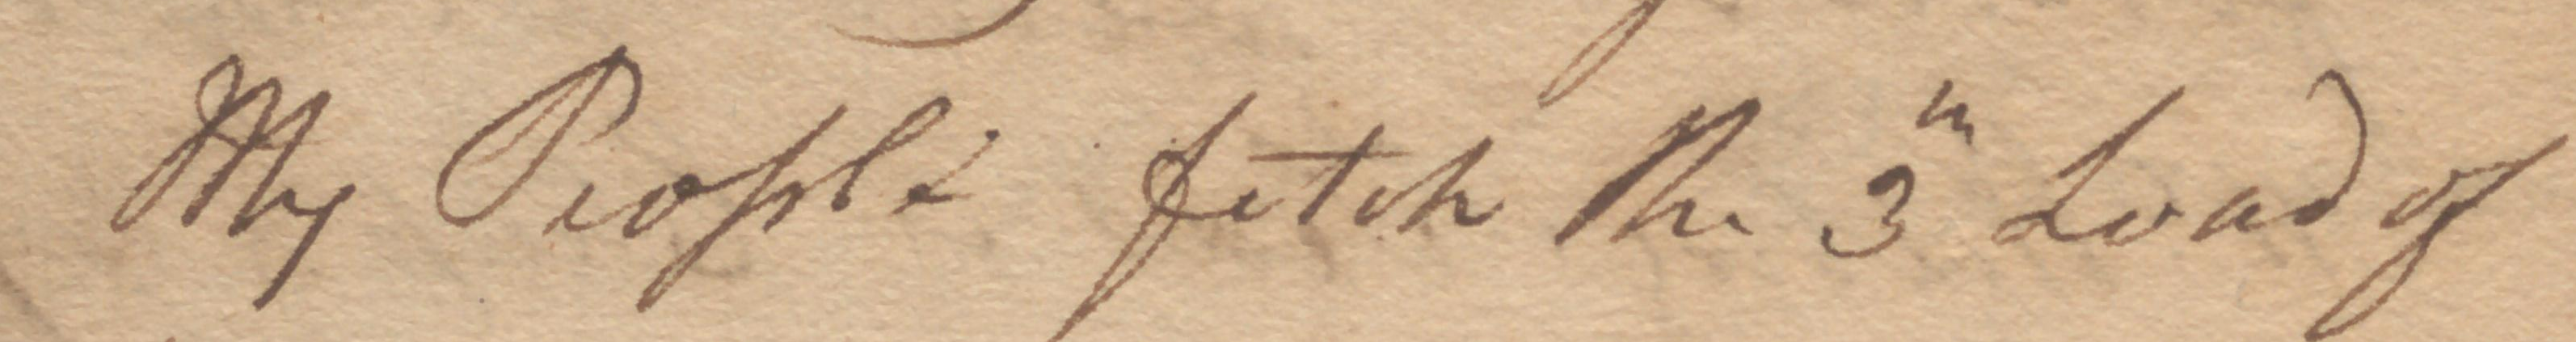My Peopls fetch the 3^th Load of
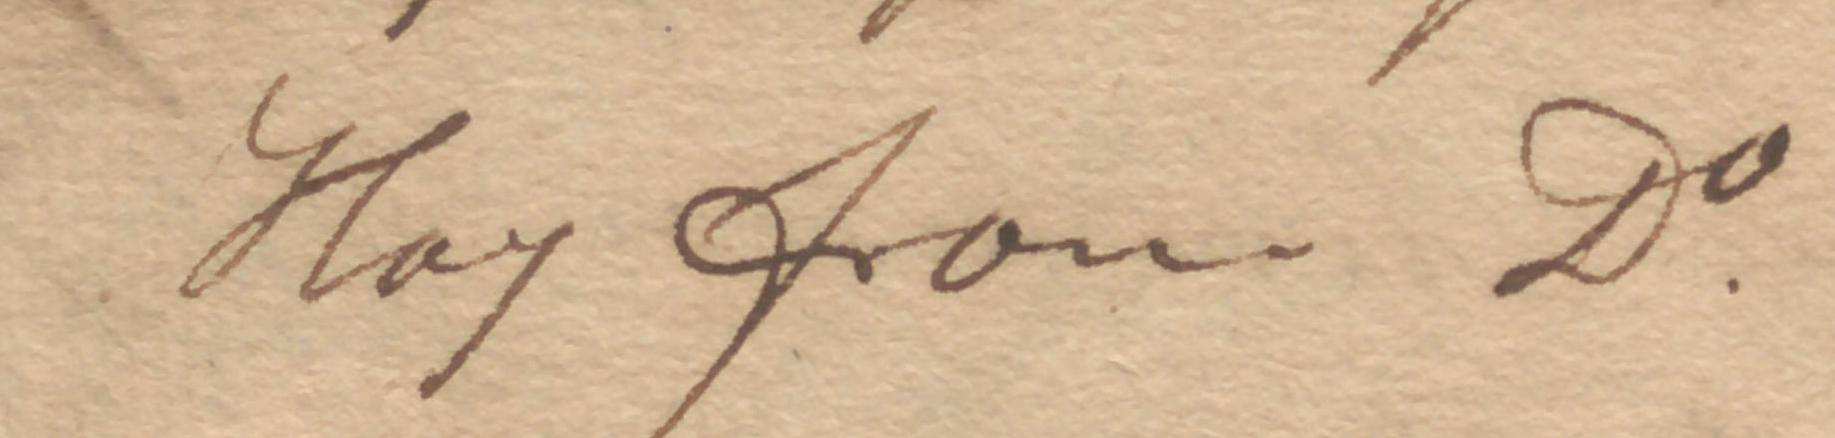Hay fron D^o.
